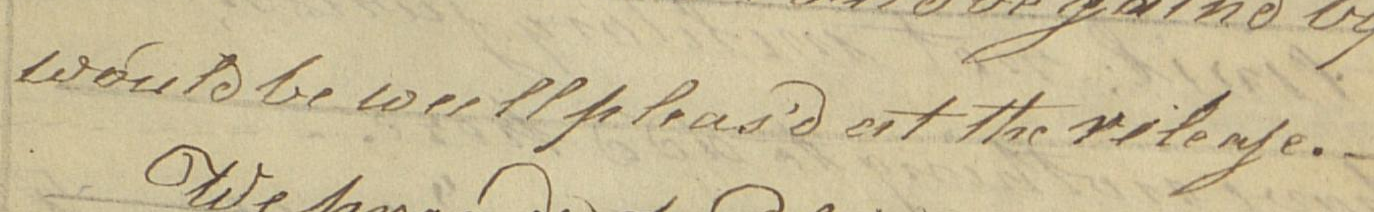would be well pleas'd at the release.
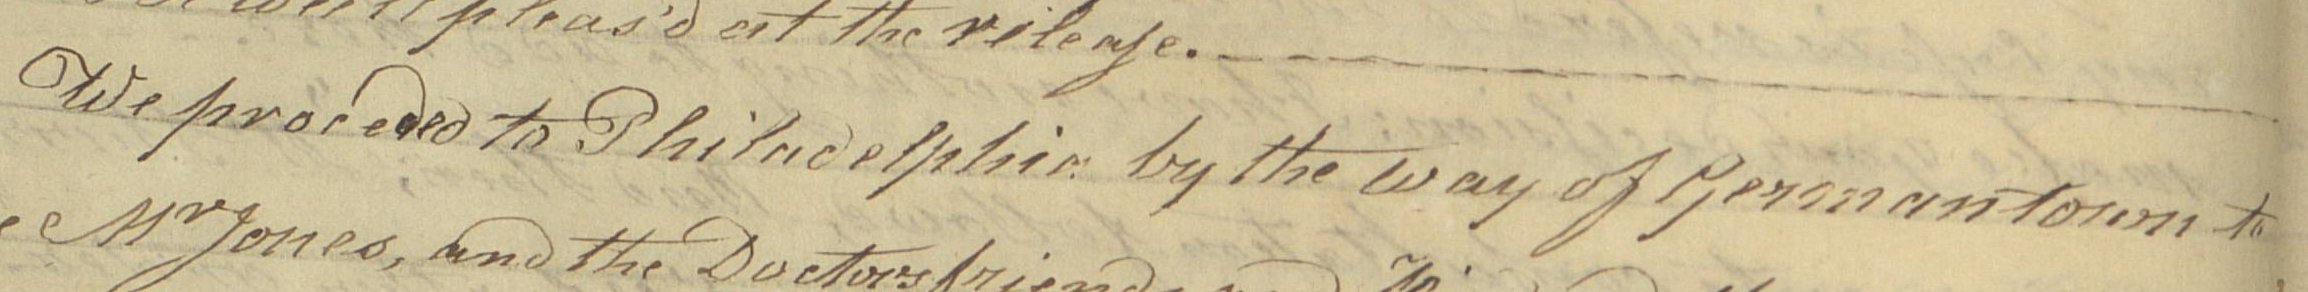We proceded to Philadelphia by the way of Germantown to
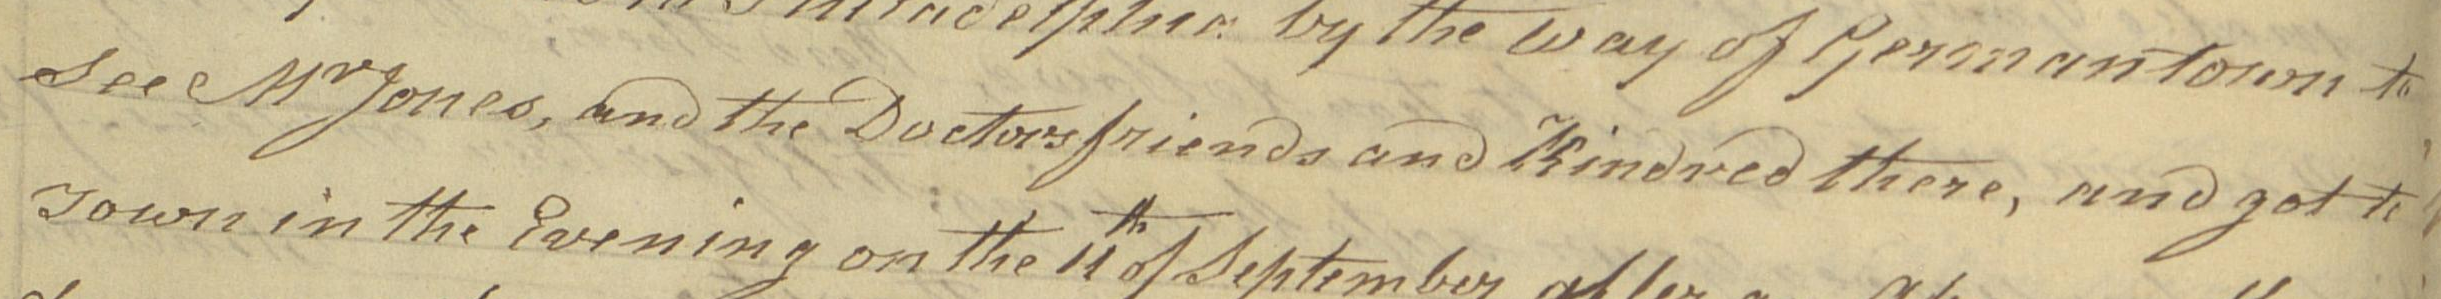See M^rJones, and the Doctors friends and kindred there, and got to
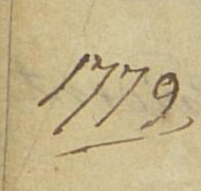1779
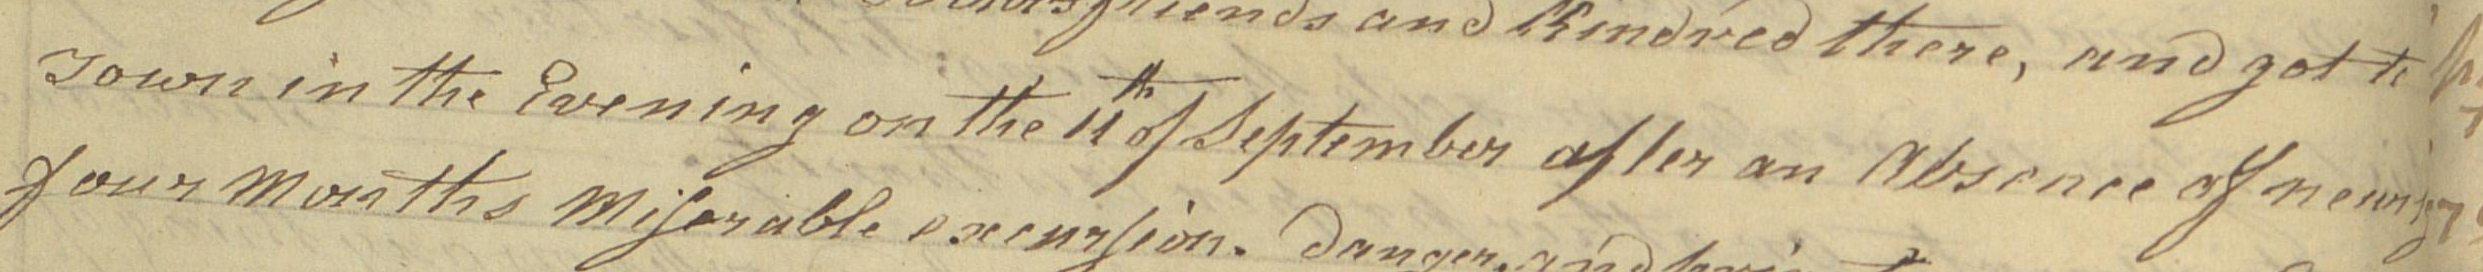town in the Evening on the 4^th of September after an Absence of neur-
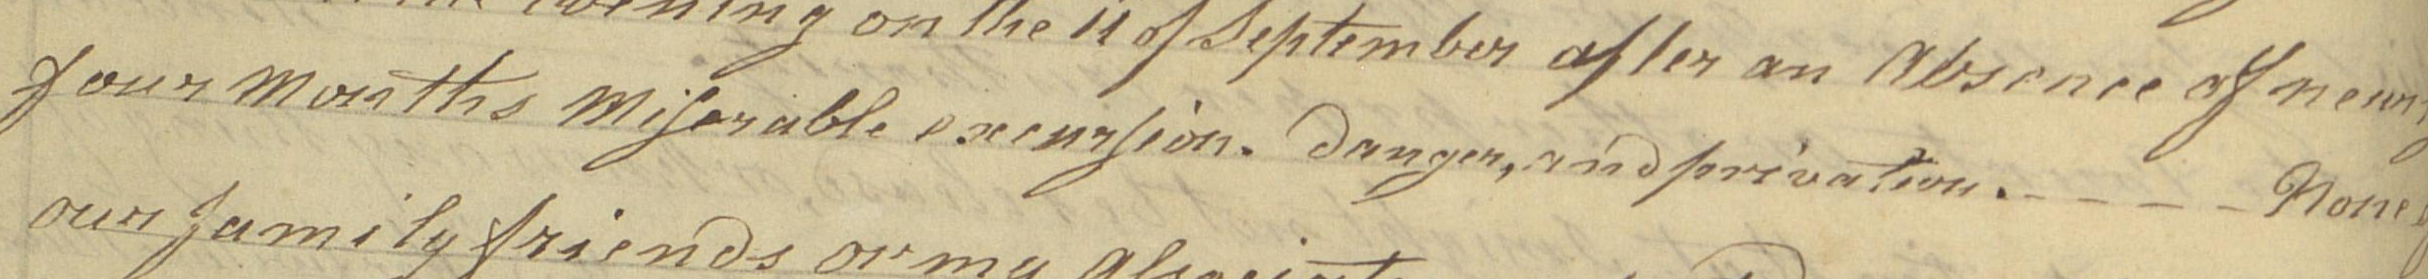four Months Miserable excursion, danger, and privation. None of
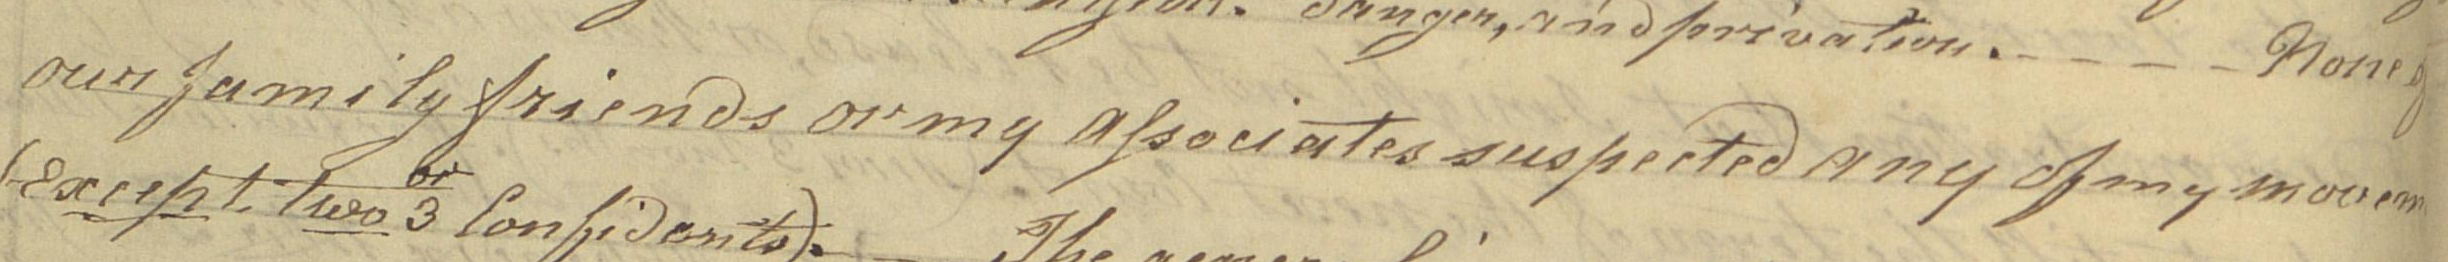our family friends or my associates suspected my of my movem-
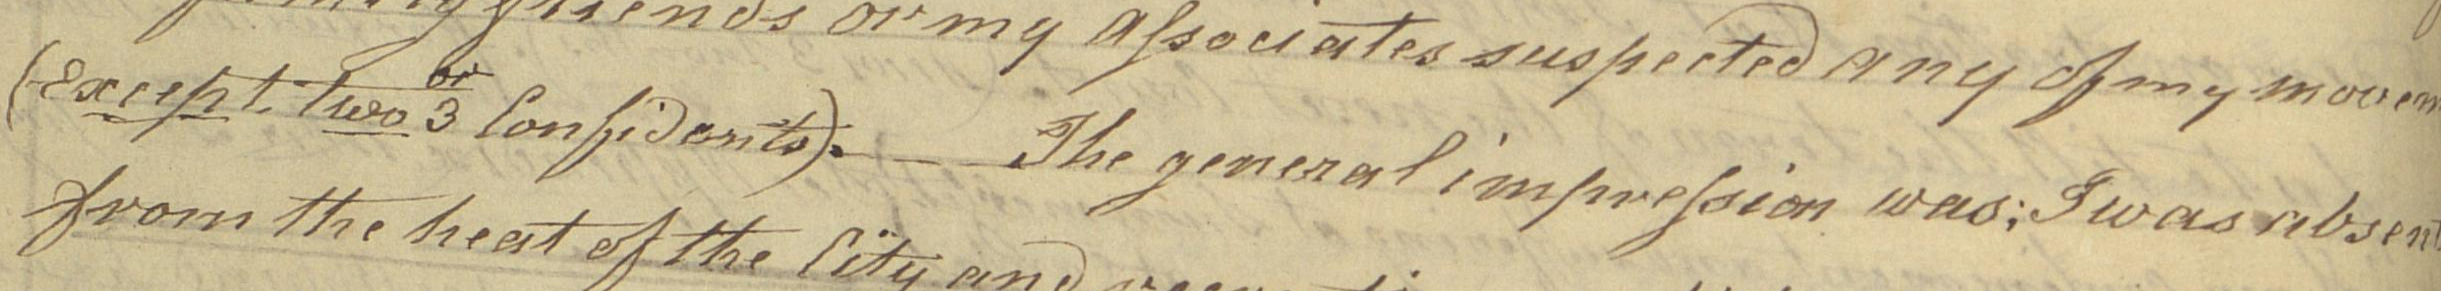(Except two ^ 3 Confidents). The general impression was I was absent
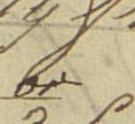or
